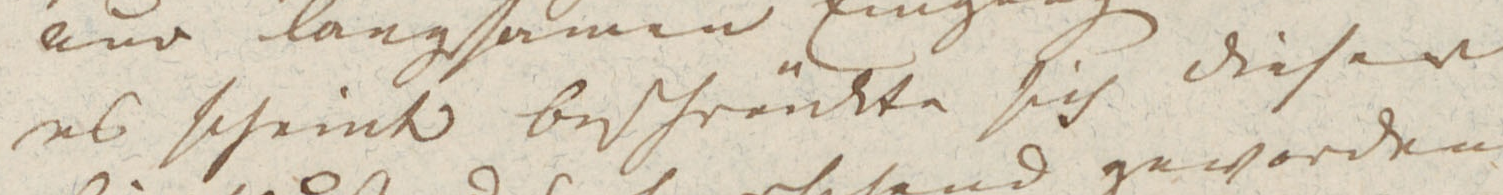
es scheint beschränkte sich dieser
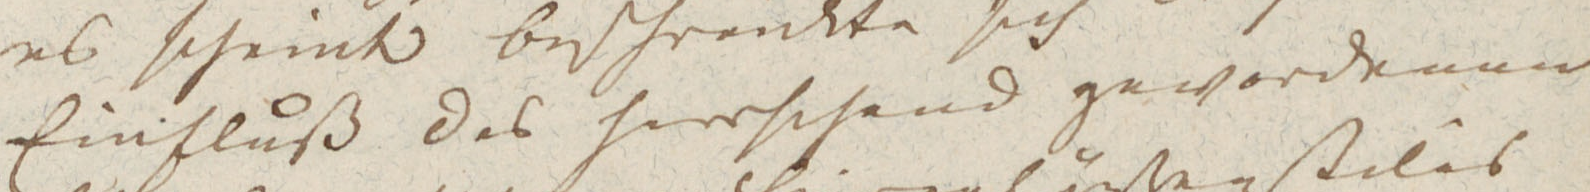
Einfluss des herrschend gewordenen
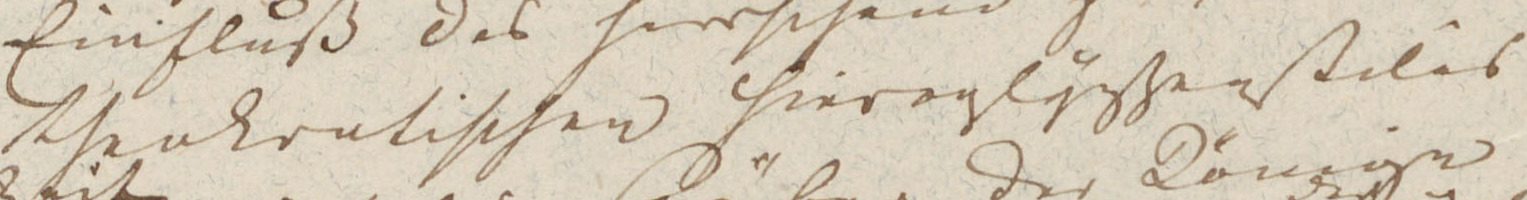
theokratischen Hieroglyphenstiles
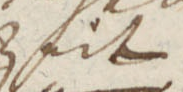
Zeit
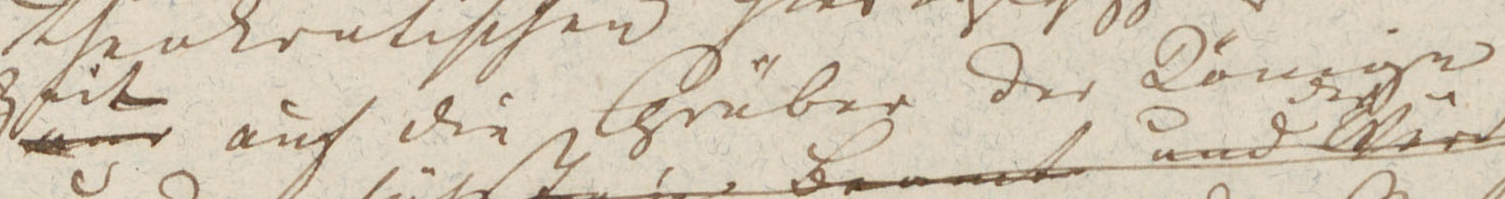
nur auf die Gräber der Könige
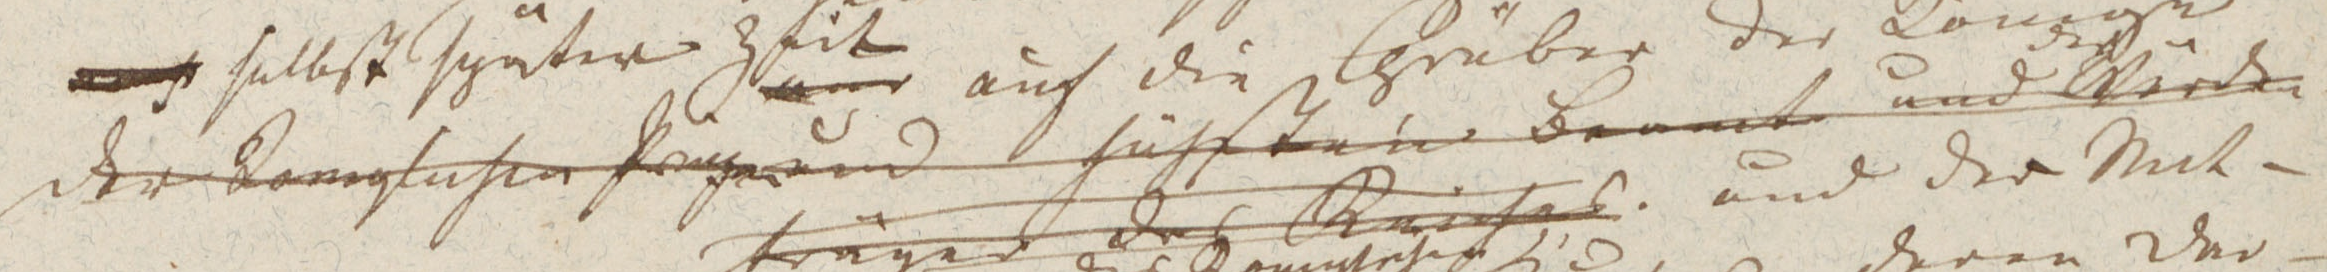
der Koniglichen Prinzen und höhster Beamt und Würden
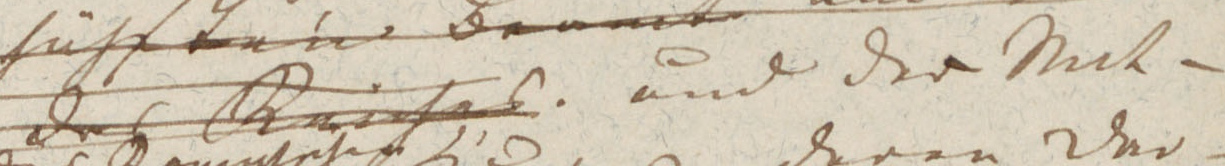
des Reiches. und der Mit-
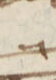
glieder
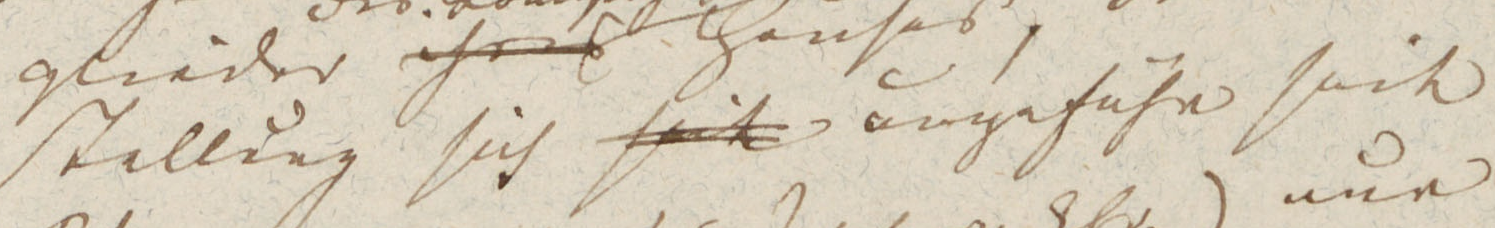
stellung sich seit ungefähr seit
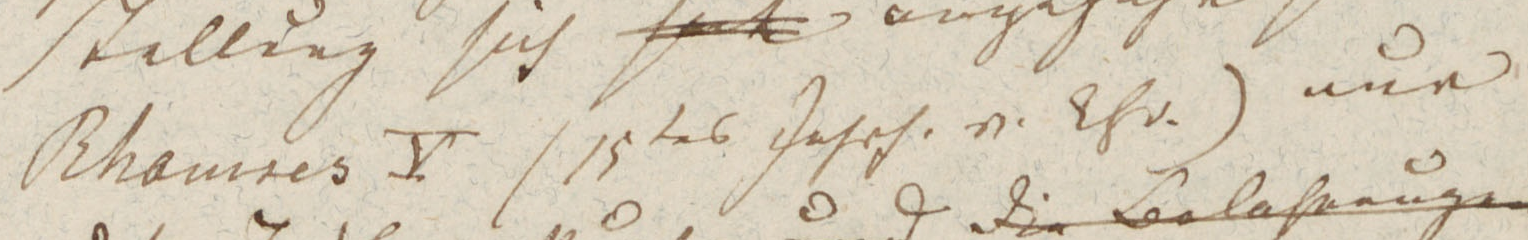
Rhamses V. (15tes Jahrh. v. Chr.) nur
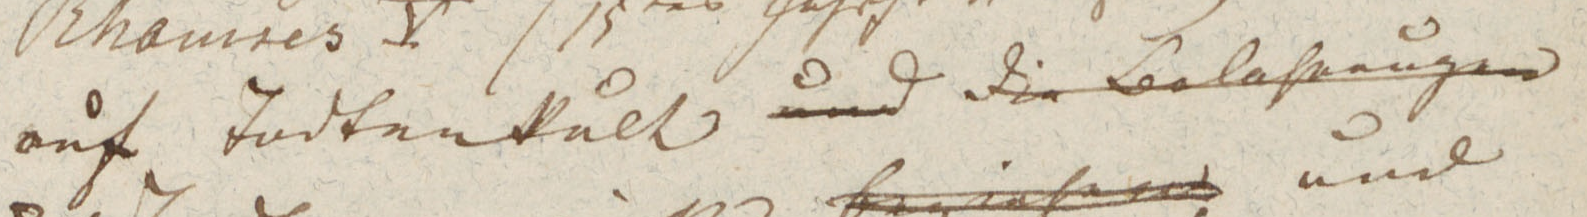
auf Todtenkult und die Lolaseaugen
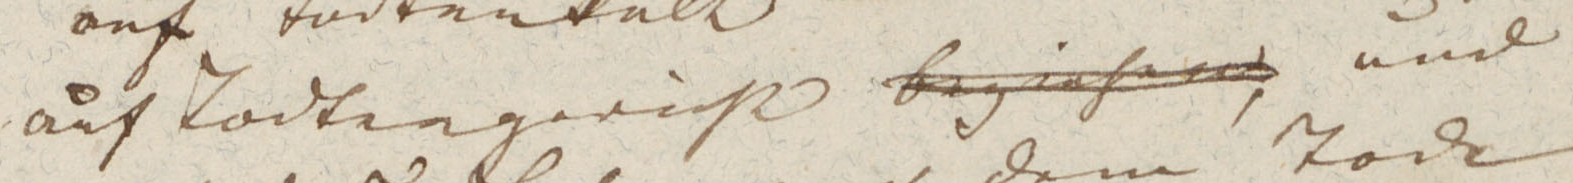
auf Todtengericht beziehen, und
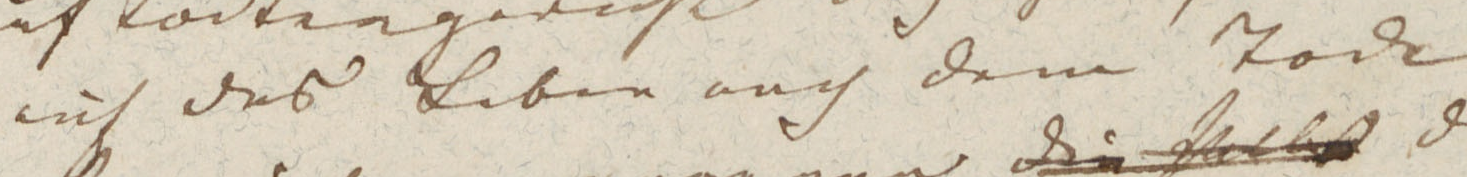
auf das Leben nach dem Tode
